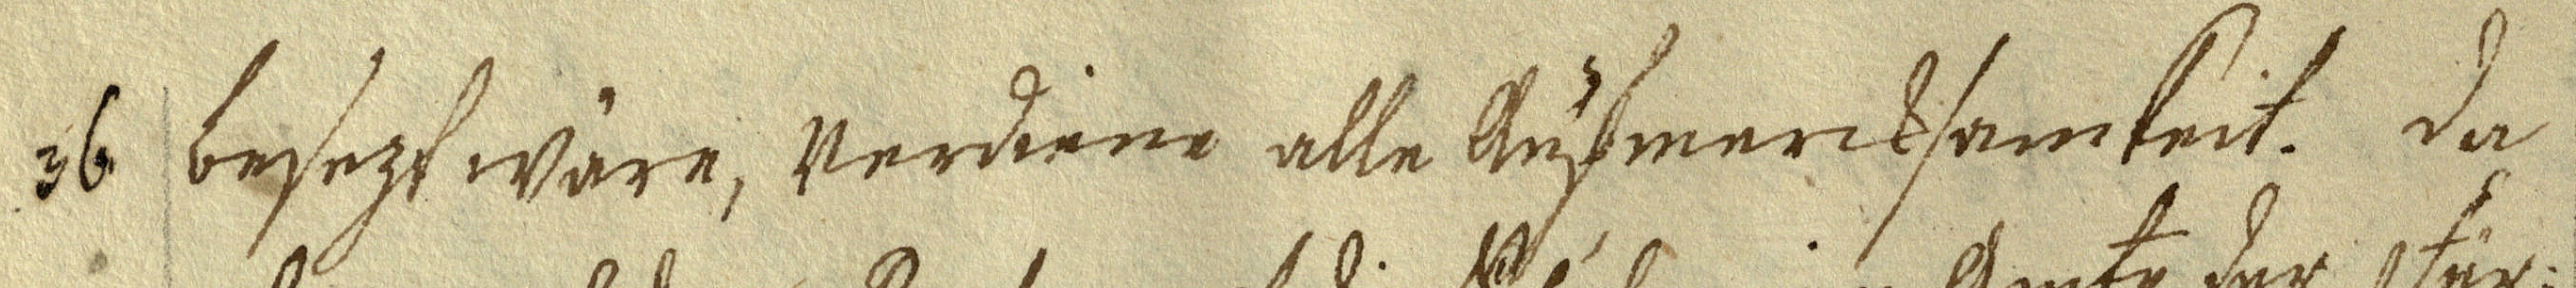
besezt wäre, verdiene alle Aufmercksamkeit. Da
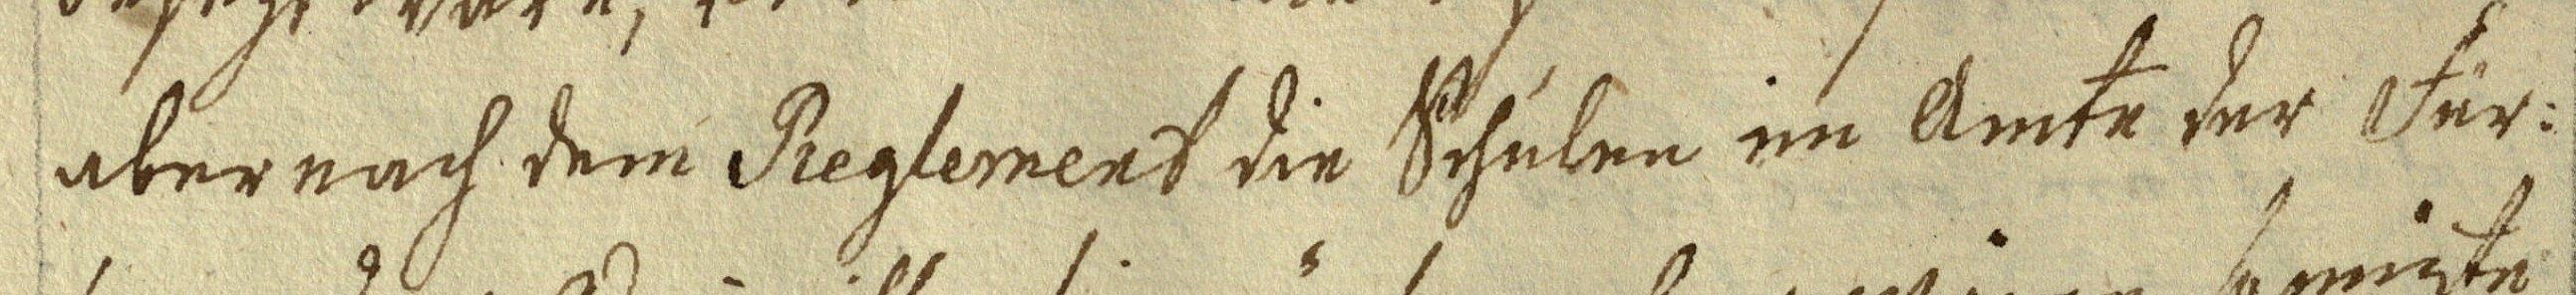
aber nach dem Reglement die Schulen im Amte der Für¬
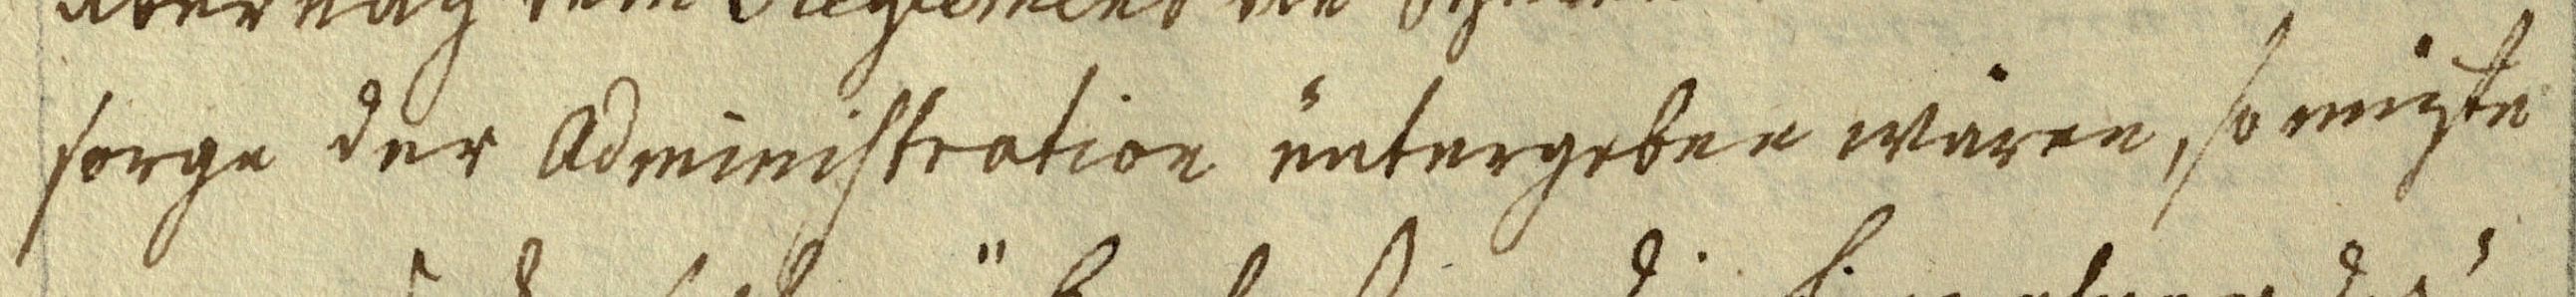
sorge der Administration untergeben wären, so müste
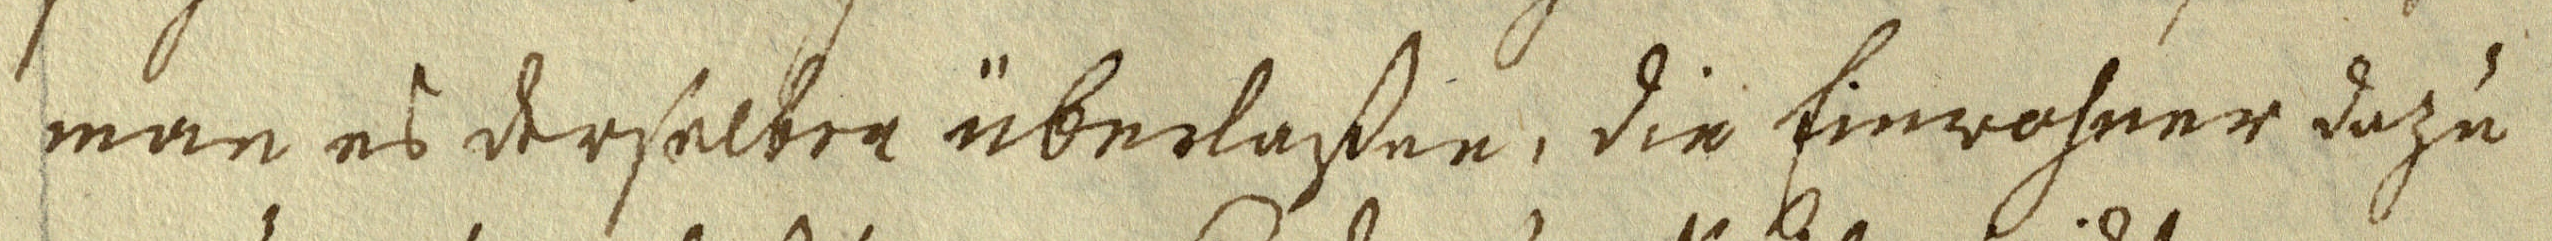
man es derselben überlaßen, die Einwohner dazu
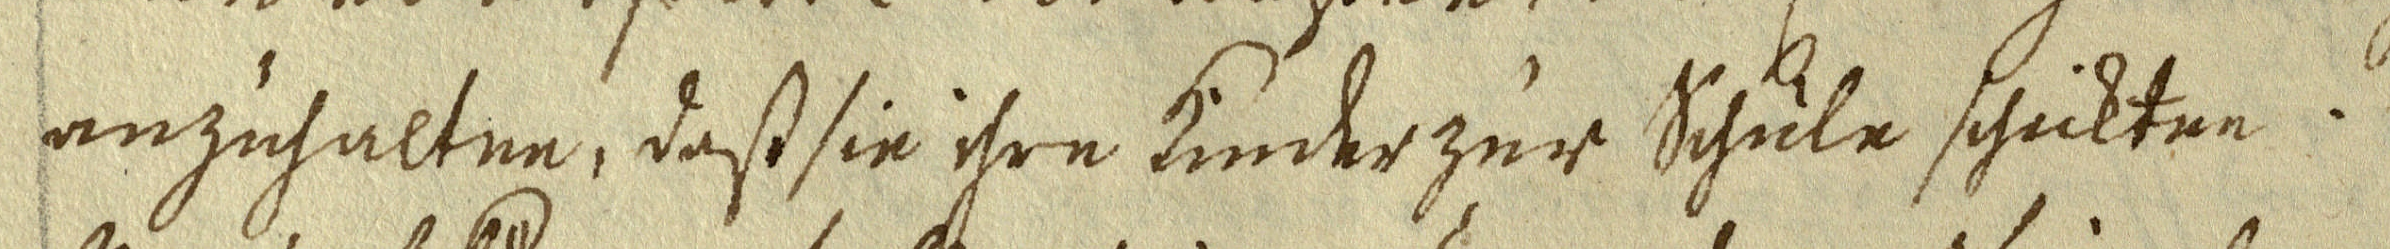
anzuhalten, daß sie ihre Kinder zur Schule schickten.
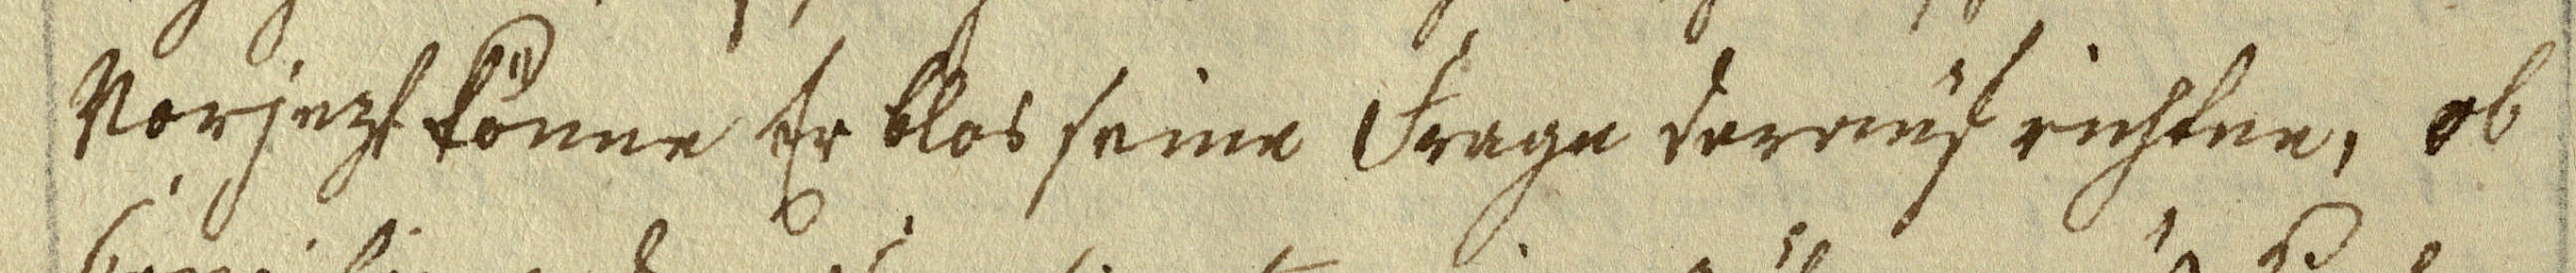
Vorjezt könne Er blos seine Frage darauf richten, ob
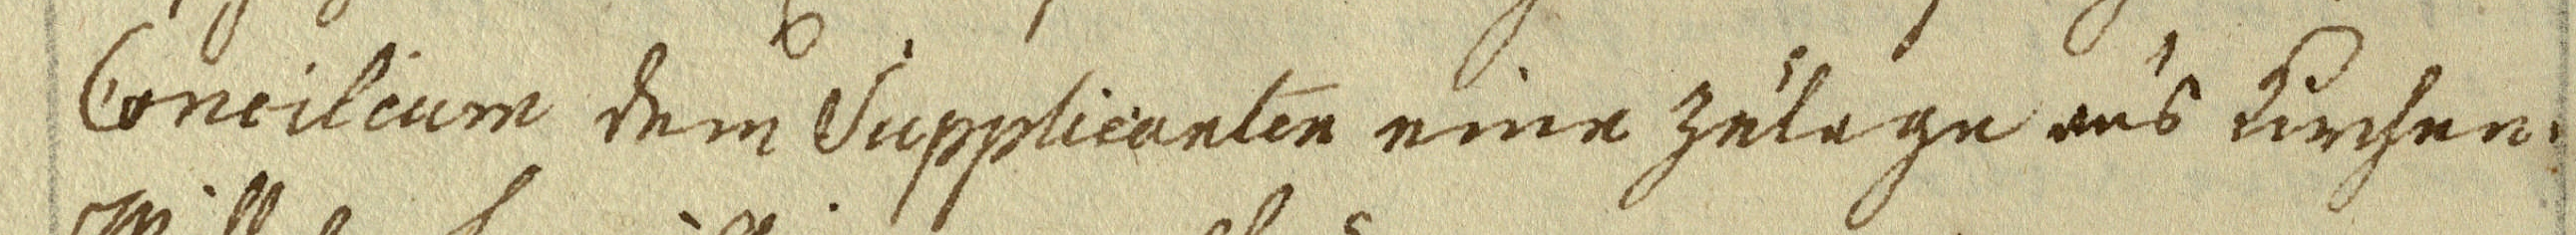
Concilium dem Supplicanten eine Zulage aus Kirchen¬
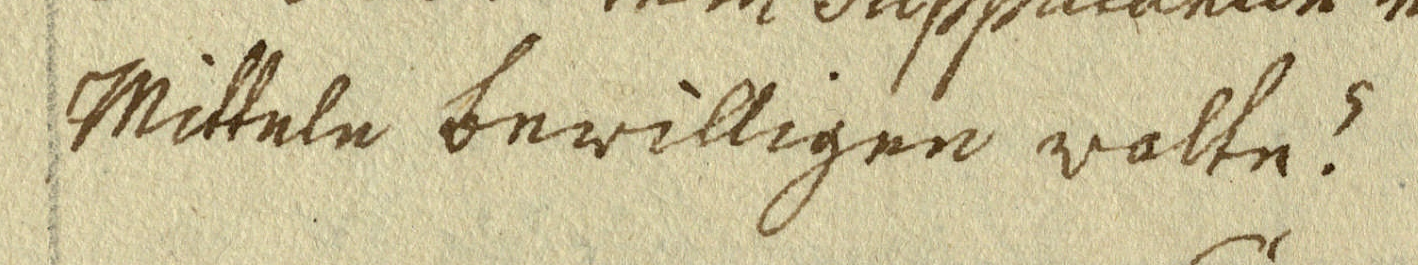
Mitteln bewilligen wolte?
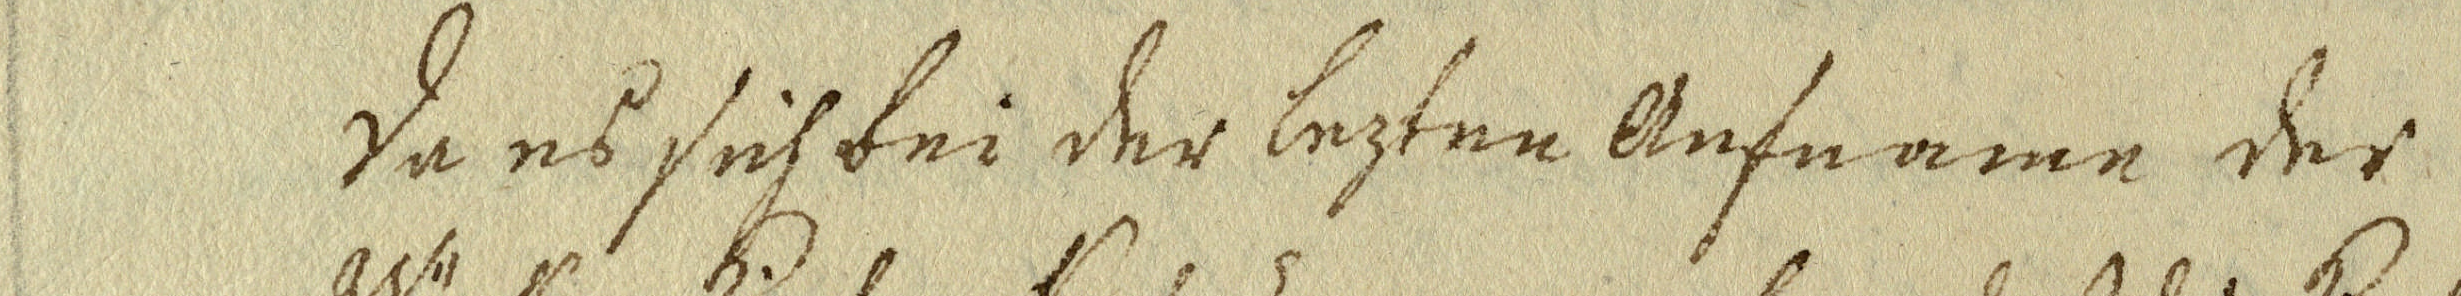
Da es sich bei der lezten Aufname der
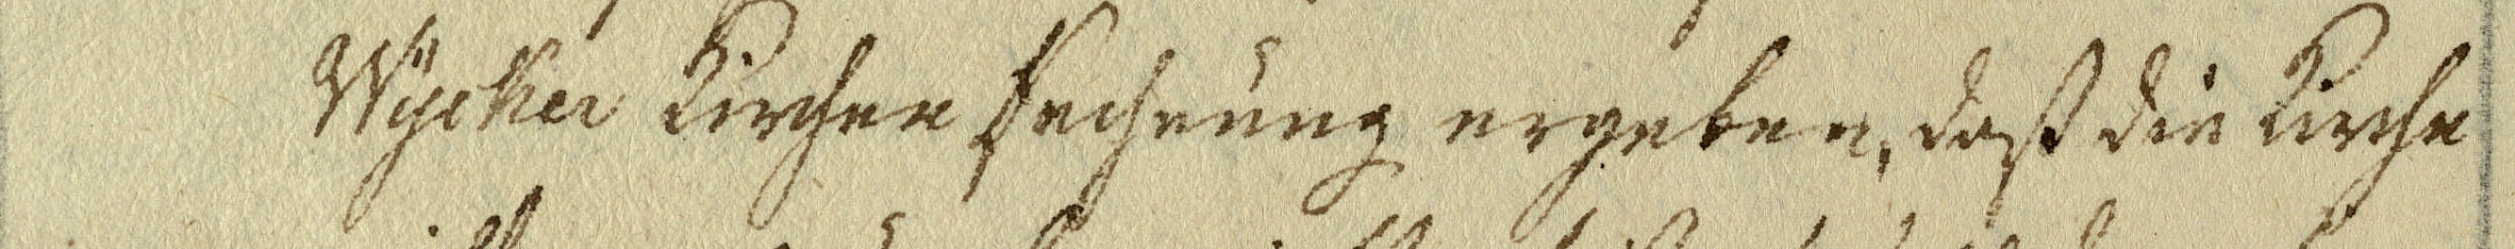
Wÿcker Kirchen Rechnung ergeben, daß die Kirche
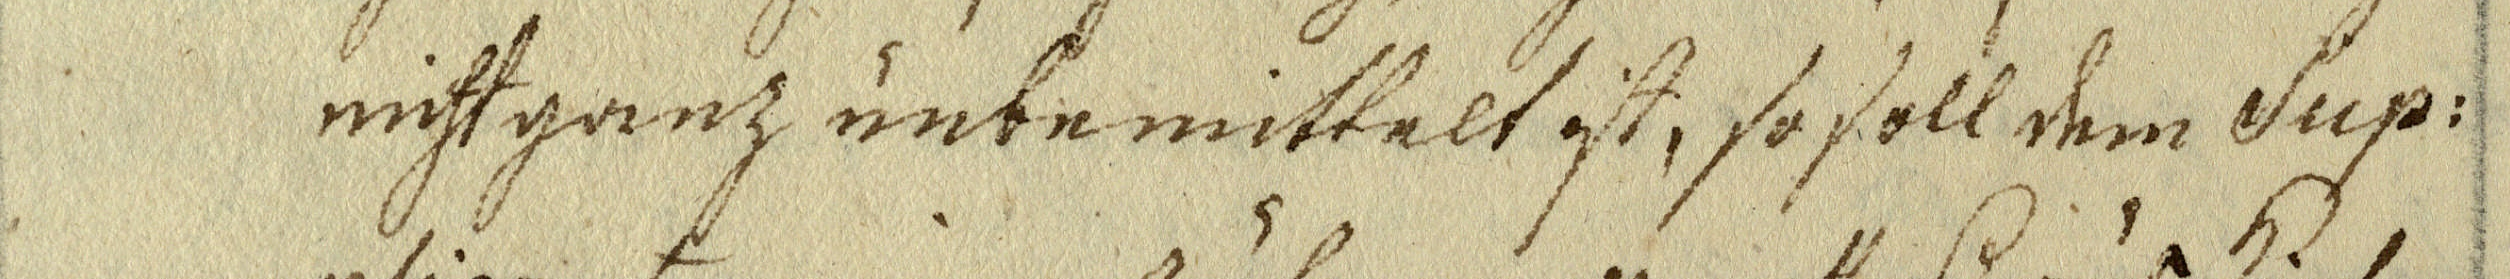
nicht ganz unbemittelt ist, so soll dem Sup¬
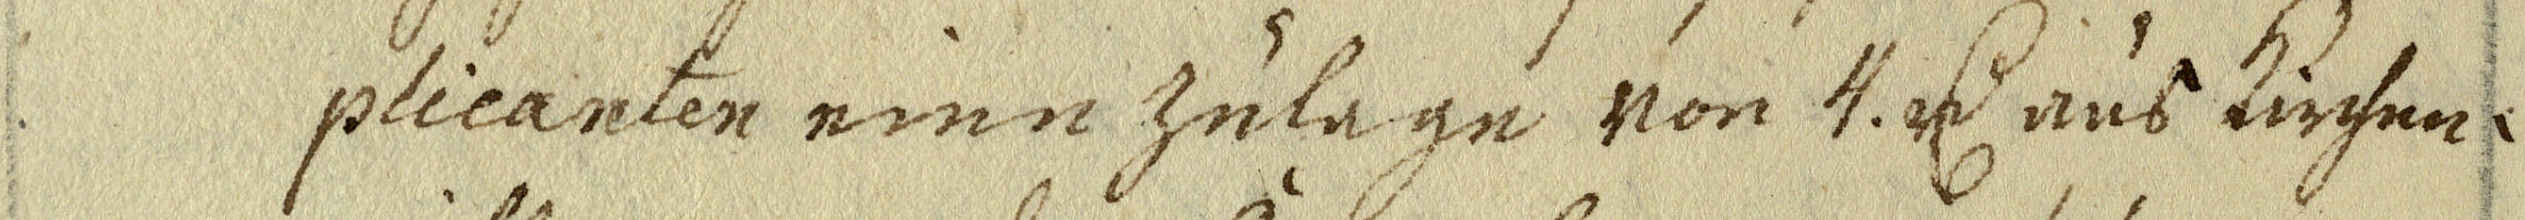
plicanten eine Zulage von 4 rt. aus Kirchen¬
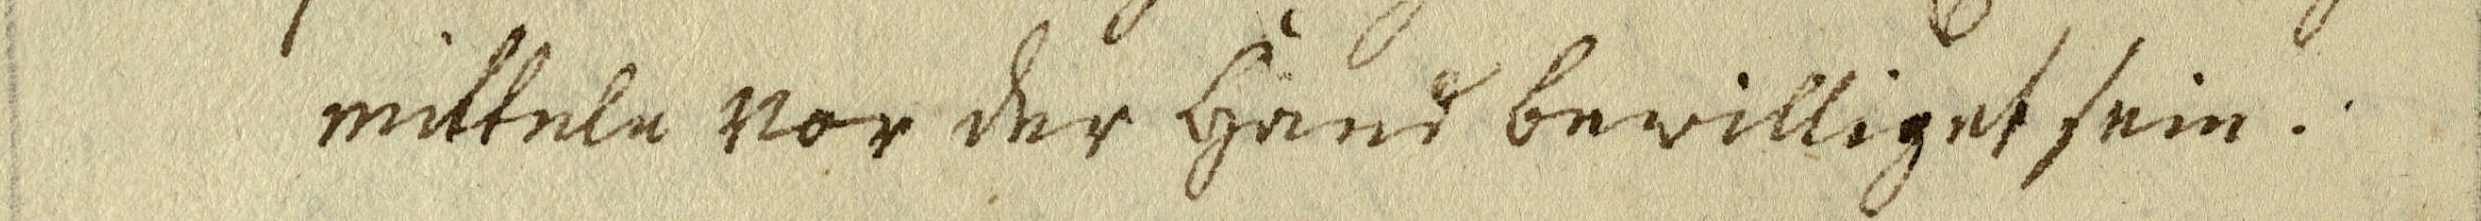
mitteln vor der Hand bewilliget sein.
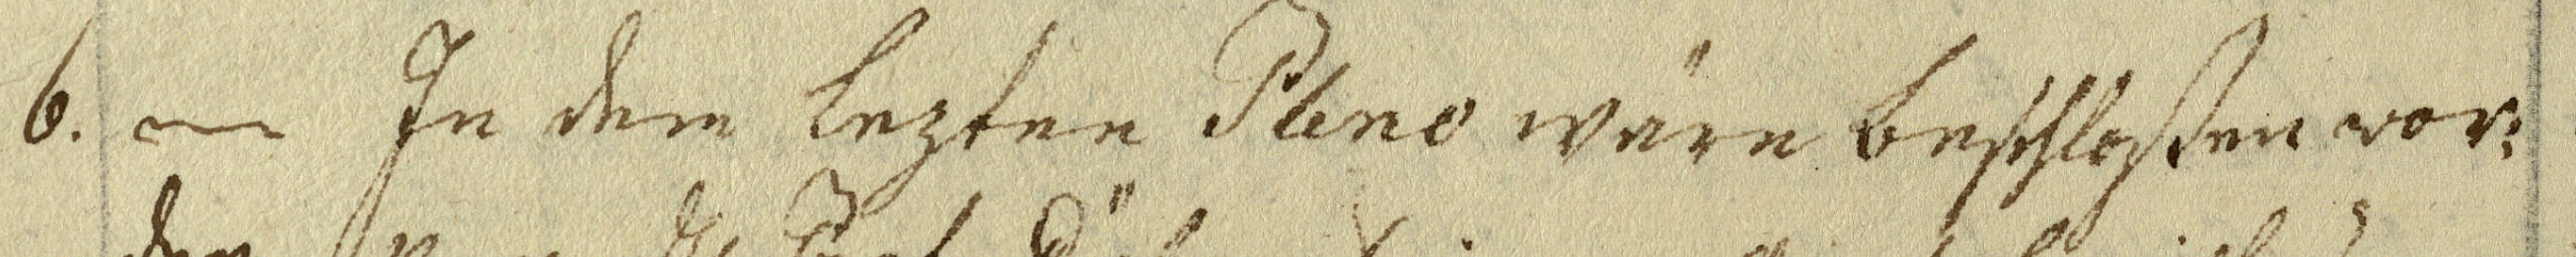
6. In dem lezten Pleno wäre schloßen wor¬
